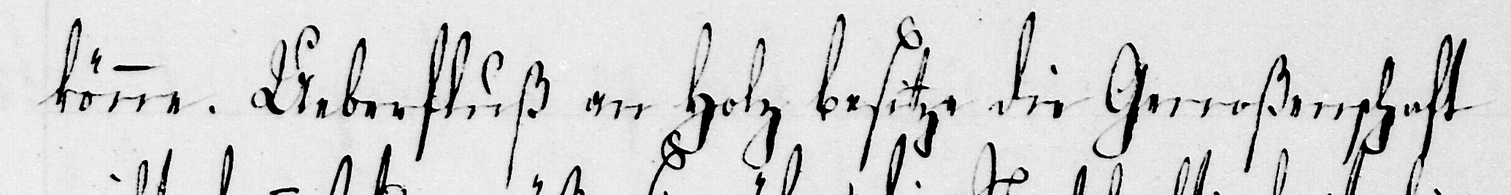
könne. Ueberfluß an Holz besitze die Genoßenschaft
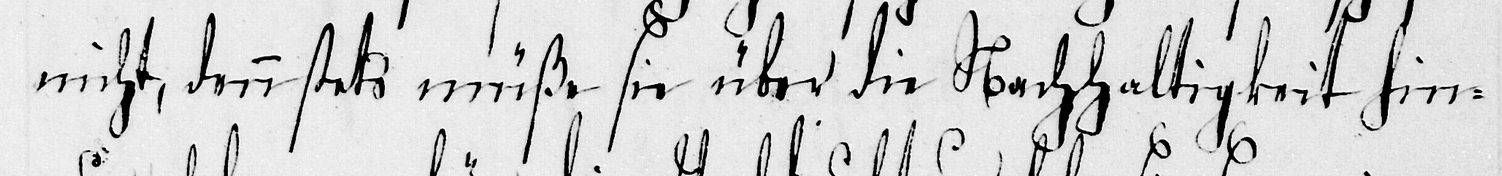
nicht, denn stets müße sie über die Nachhaltigkeit hin¬
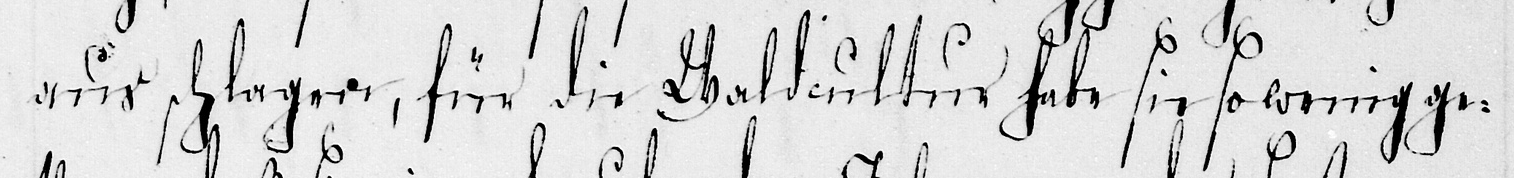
aus schlagen, für die Waldcultur habe sie so wenig ge¬
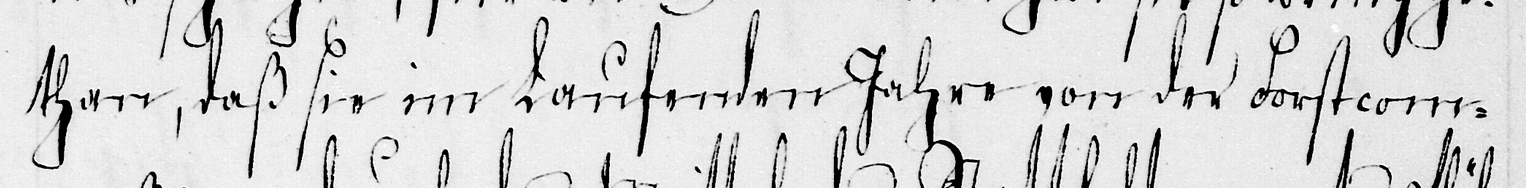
than, daß sie im Laufenden Jahre von der Forstcom¬
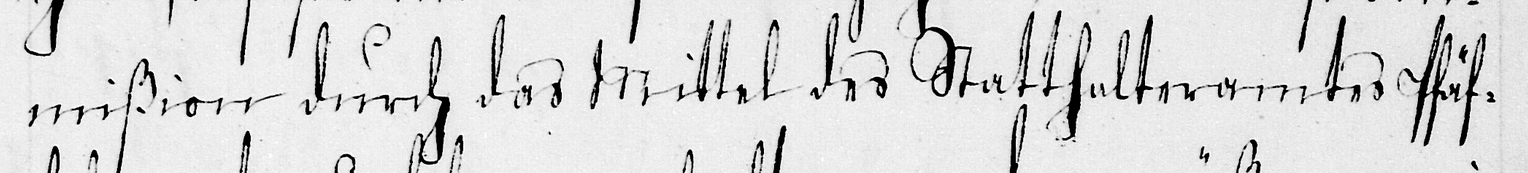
mißion durch das Mittel des Statthalteramtes Pfäf¬
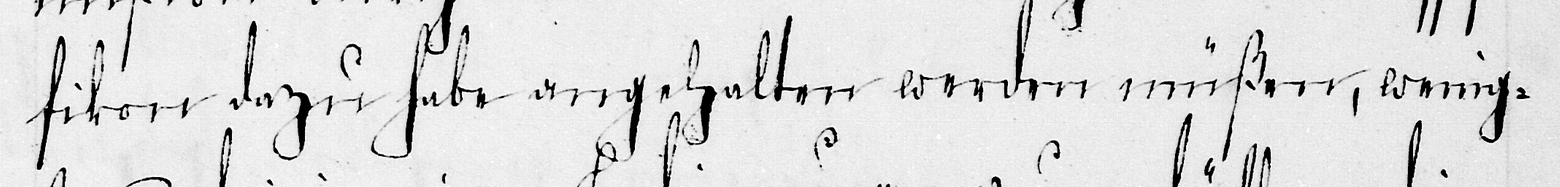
fikon dazu habe angehalten werden müßen, wenig¬
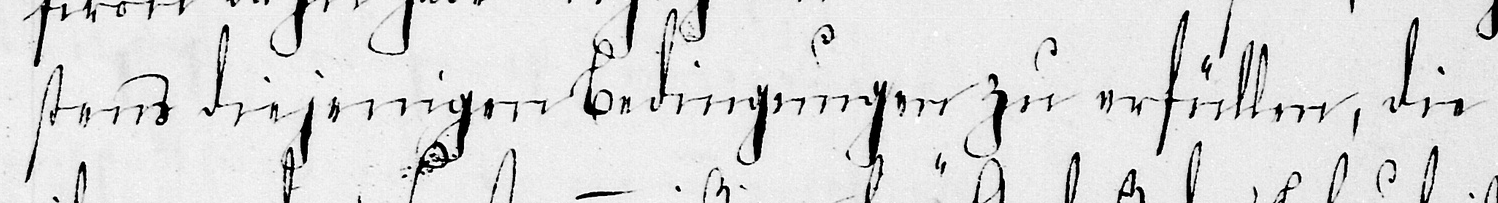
sten diejenigen Bedingungen zu erfüllen, die
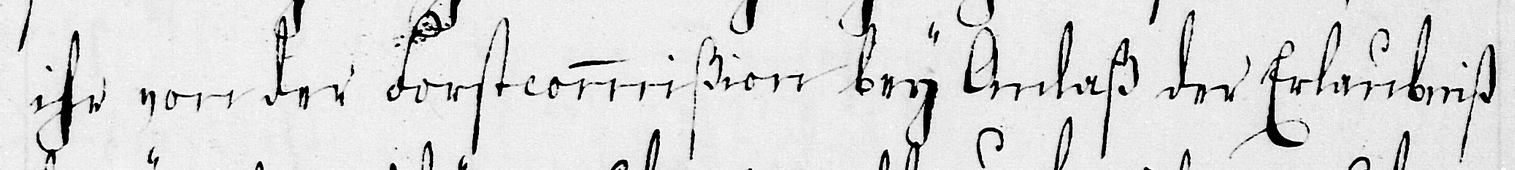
ihr von der Forstcommißion bey Anlaß der Erlaubniß
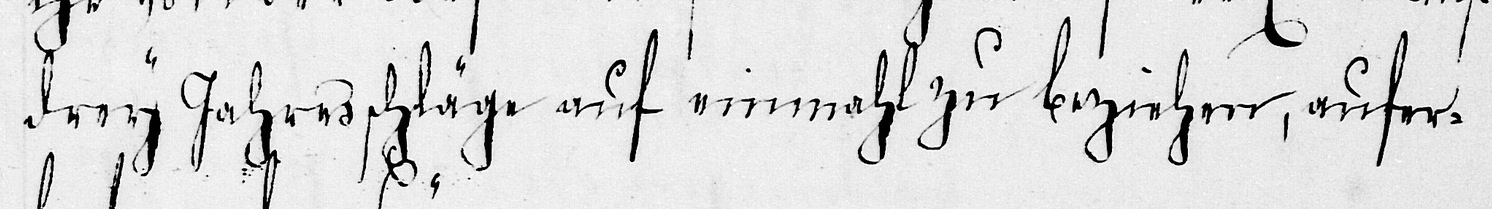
drey Jahresschläge auf einmahl zu beziehen, aufer¬
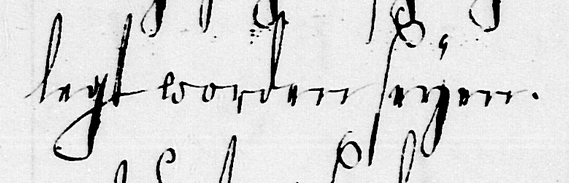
legt worden seyen.
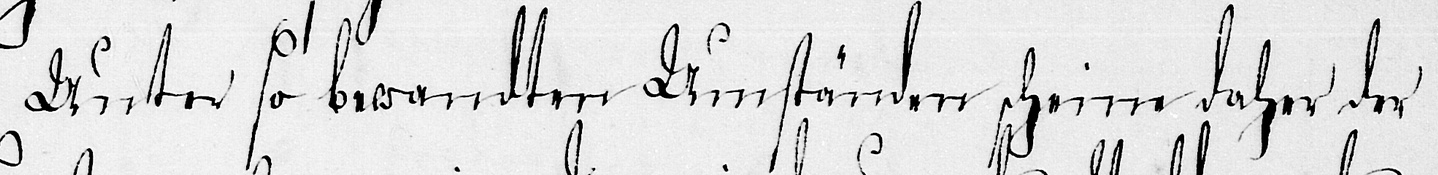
Unter so bewandten Umständen scheine daher der
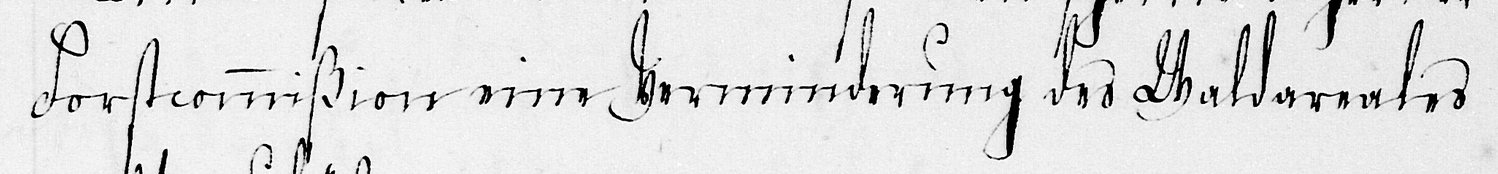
Forstcommißion eine Verminderung des Waldareales
